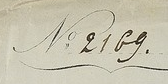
No 2109.
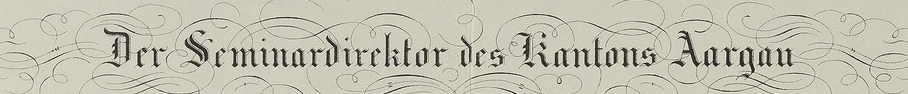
Der Seminardirektor des Kantons Aargau
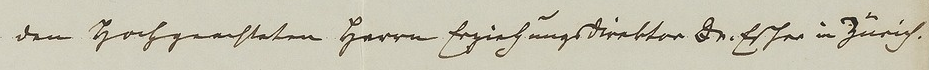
den Hochgeachteten Herrn Erziehungsdirektor Dr. Escher in Zürich.
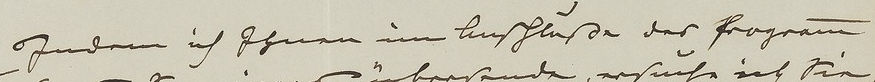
Indem ich Ihnen im Anschluße das Programm
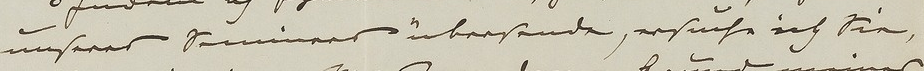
unseres Seminars übersende, ersuche ich Sie,
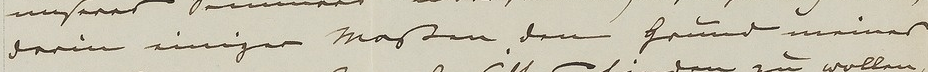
darin einiger Maßen den Grund meines
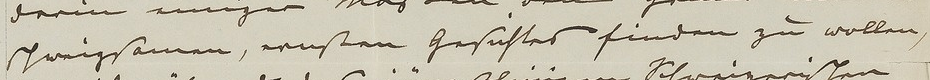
schweigsamen, ernsten Gesichtes finden zu wollen,
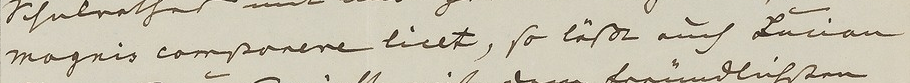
magnis componere licet, so läßt auch Lucian
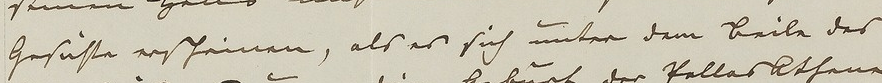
Gesichte erscheinen, als es sich unter dem Beile des
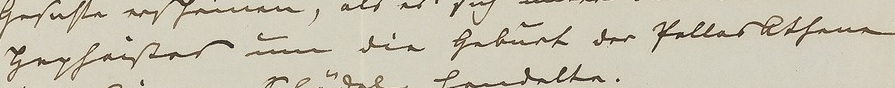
Hephaistos um die Geburt der Pallas Athene
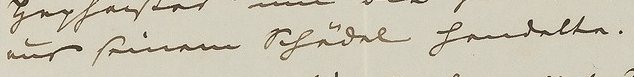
aus seinem Schädel handelte.
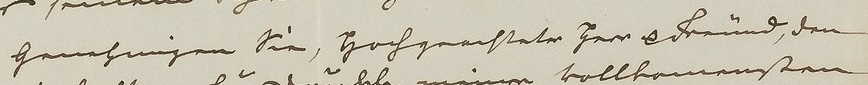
Genehmingen Sie, Hochgeachteter Herr & Freund, den
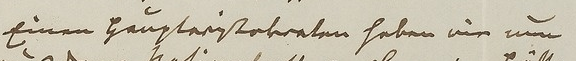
Einen Hauptaristokraten haben wir nun
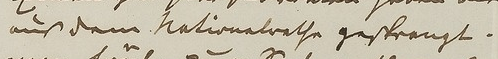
aus dem Nationalrathe gesprengt.
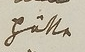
Hätte
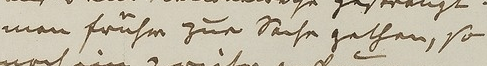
man früher zur Sache gethan, so
